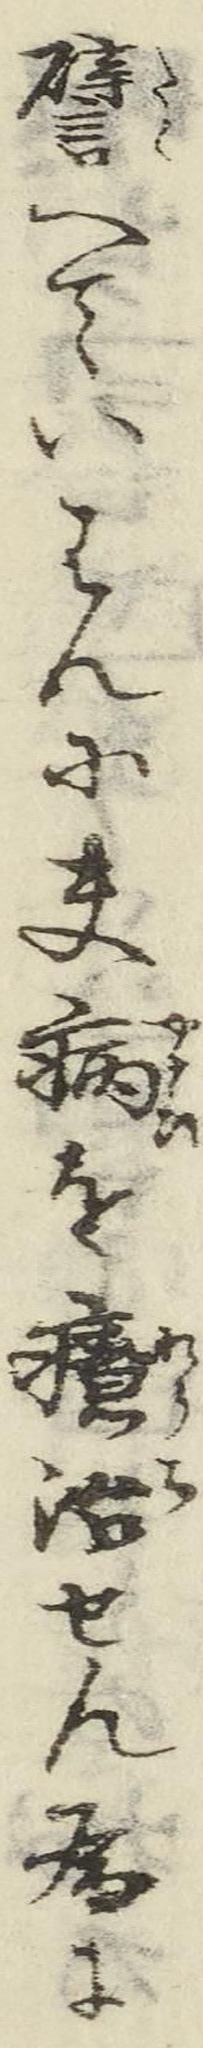譬へていはんに夫病を療治せん為に
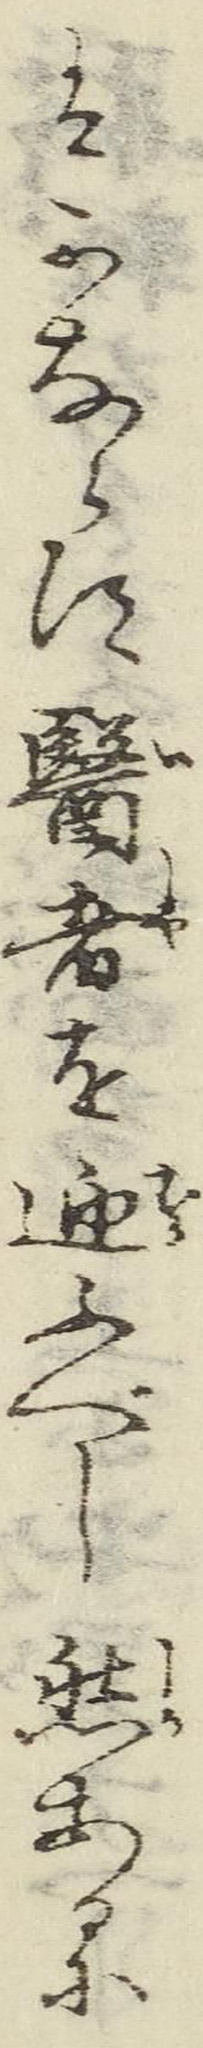はかならす医者を迎ふべし然あるに
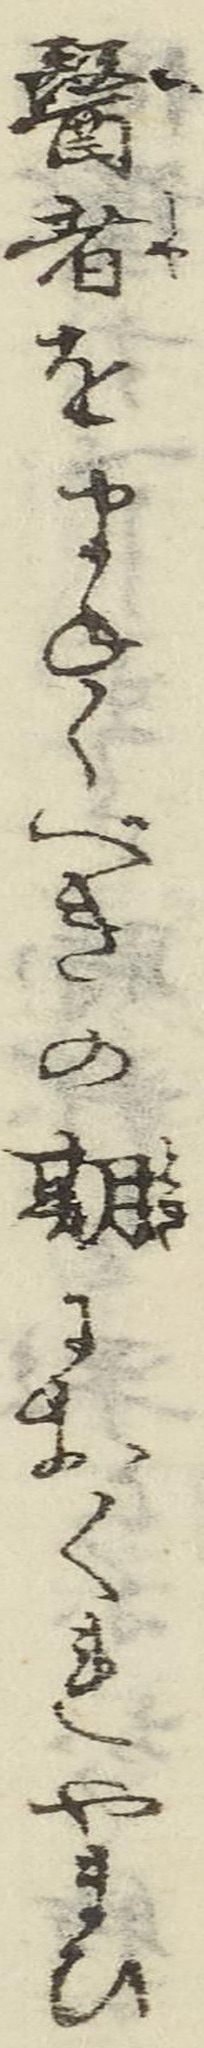医者をまねくべきの期におくれやまひ
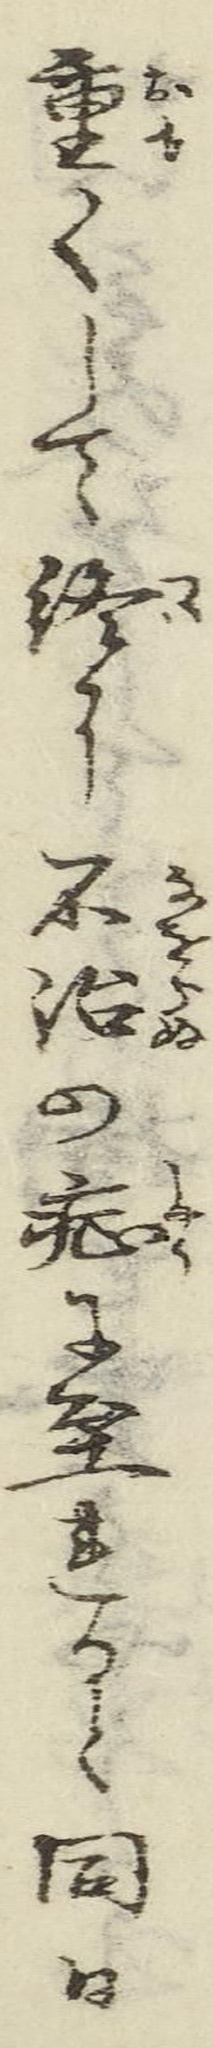重くして終に不治の症に至れると同日
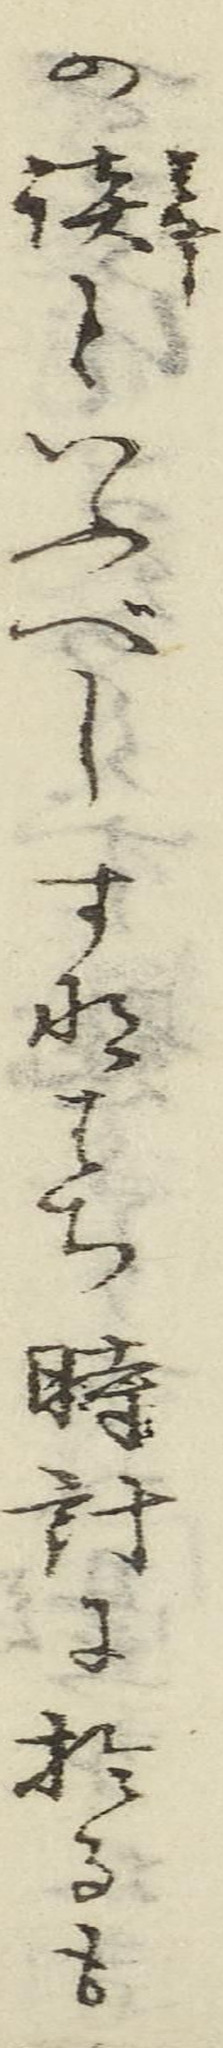の談といふべしすなはち時計に於るも
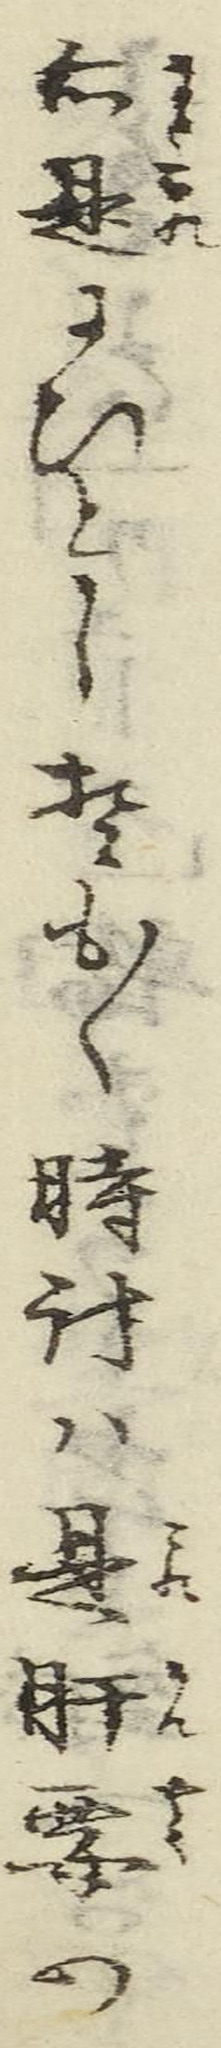亦是にひとしそも〳〵時計は是肝要の
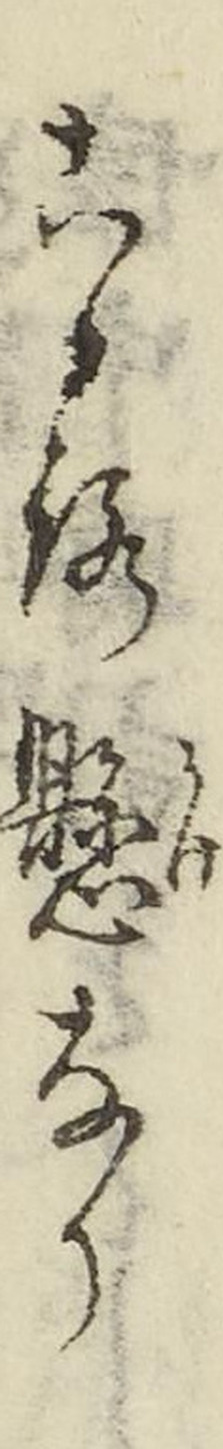こゝろ懸なり

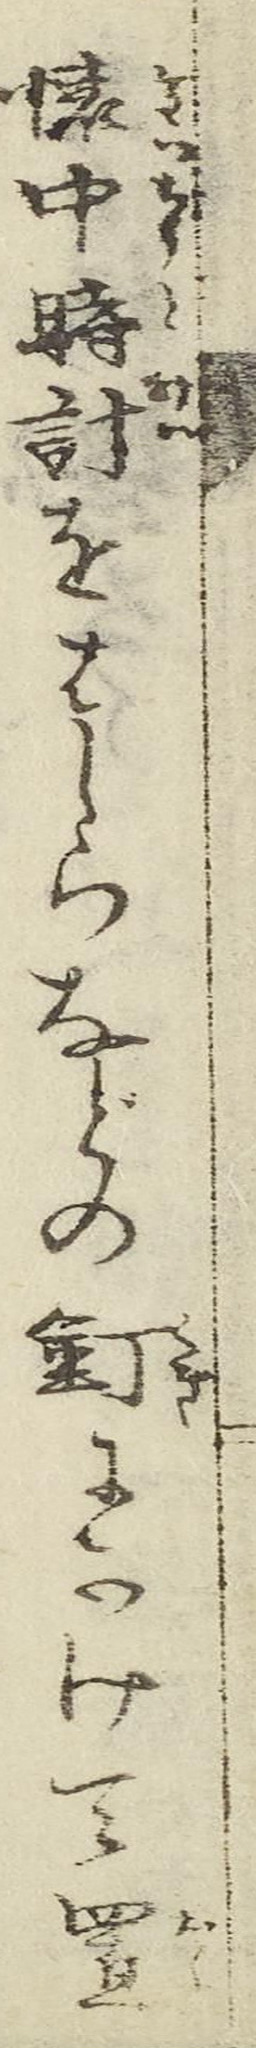懐中時計をはしらなどの釘にかけて置
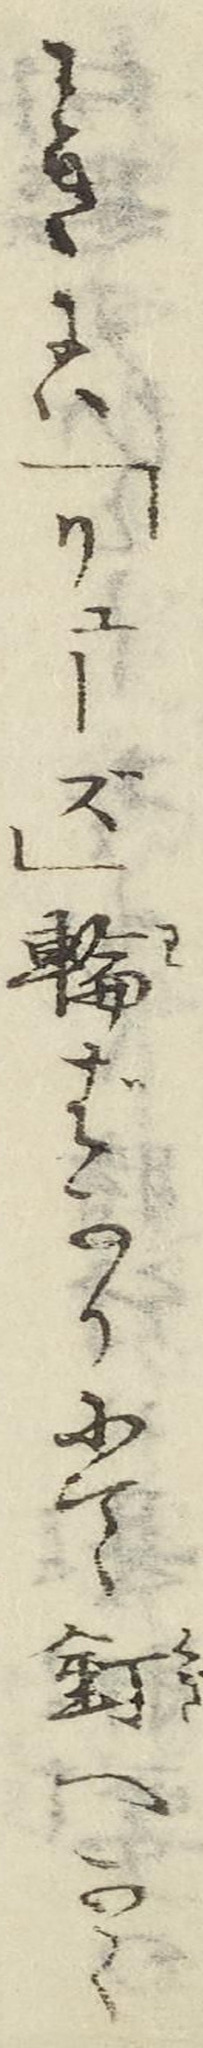ときには「リューズ」輪ばかりにて釘へかく
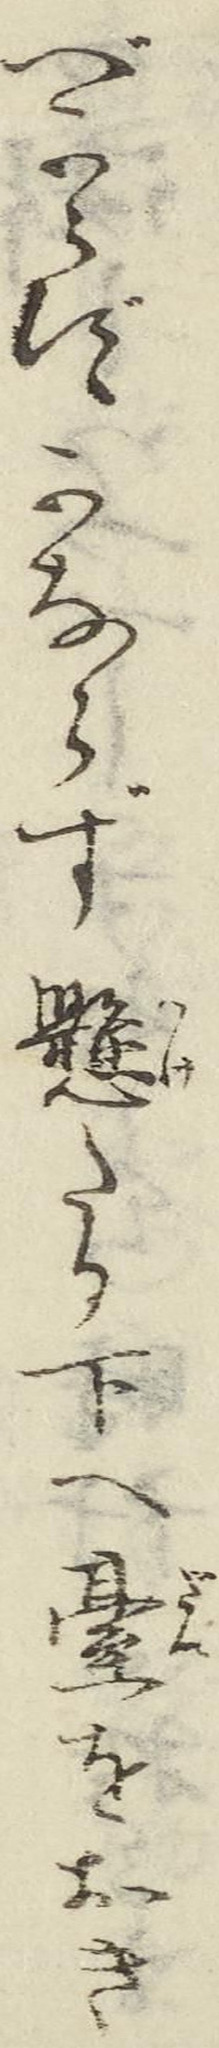べからずかならず懸たる下へ台をおき
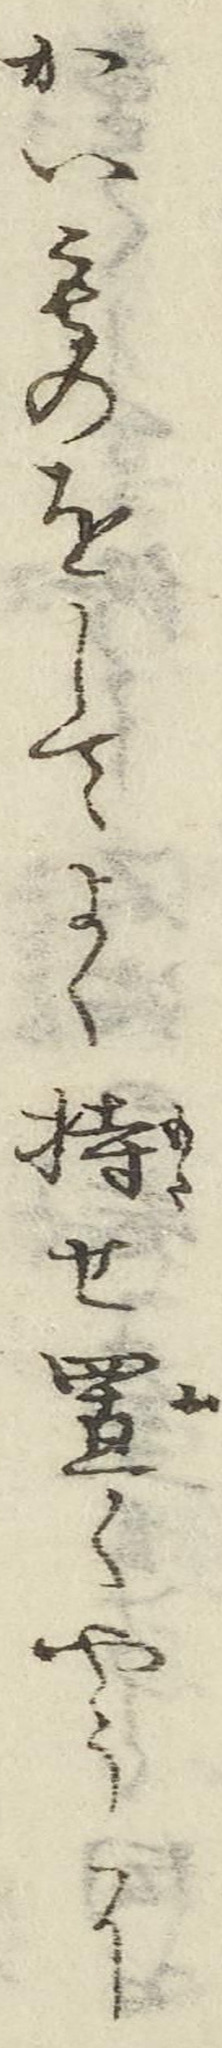かいものをしてよく持せ置くやうに
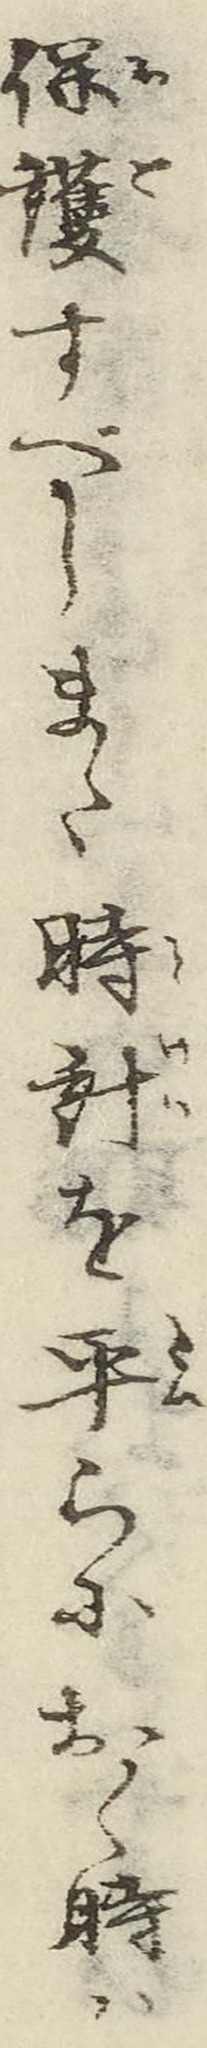保護すべしまた時計を平らにおく時は
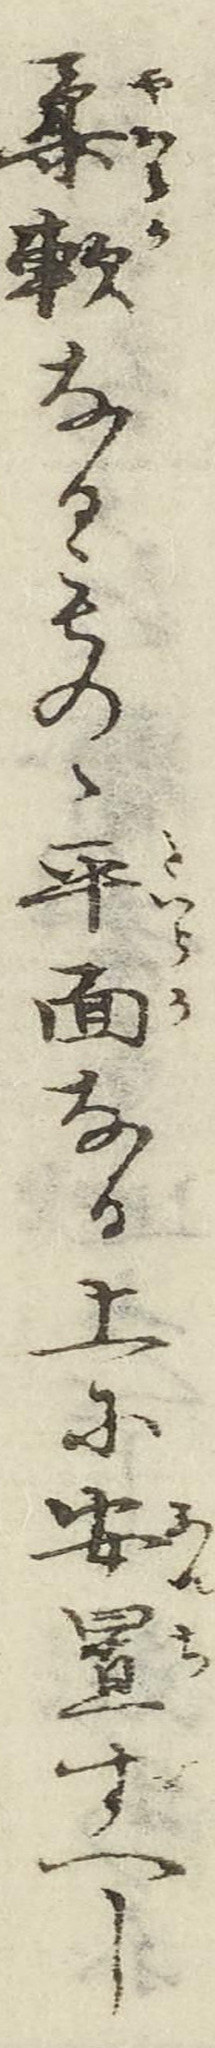柔軟なるものゝ平面なる上に安置すへし
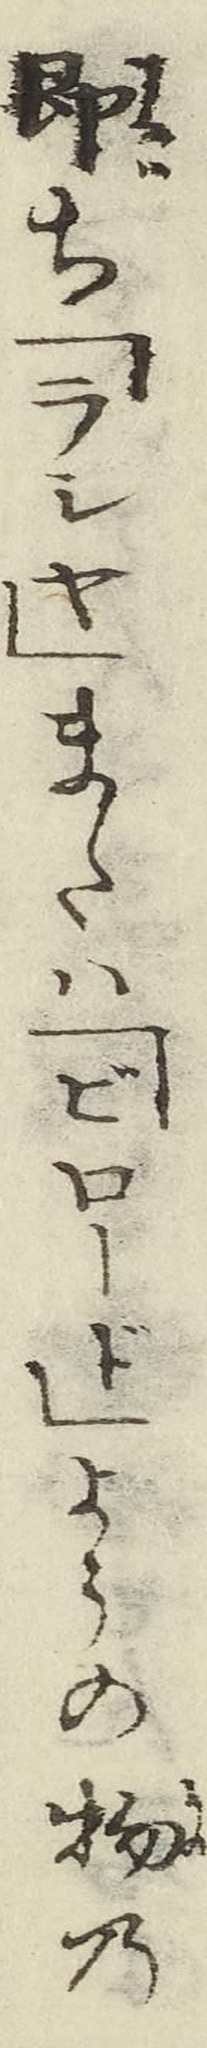即ち「ラシヤ」または「ビロード」ようの物の
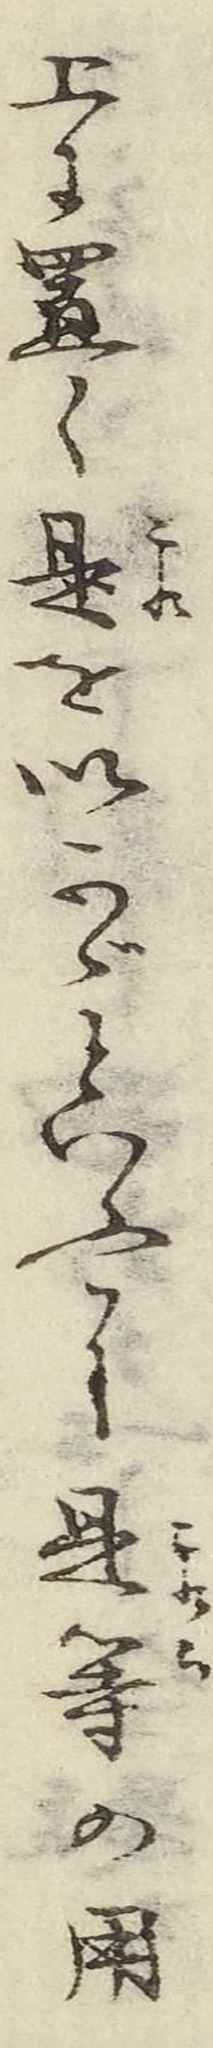上に置く是をいかゞといふに是等の用
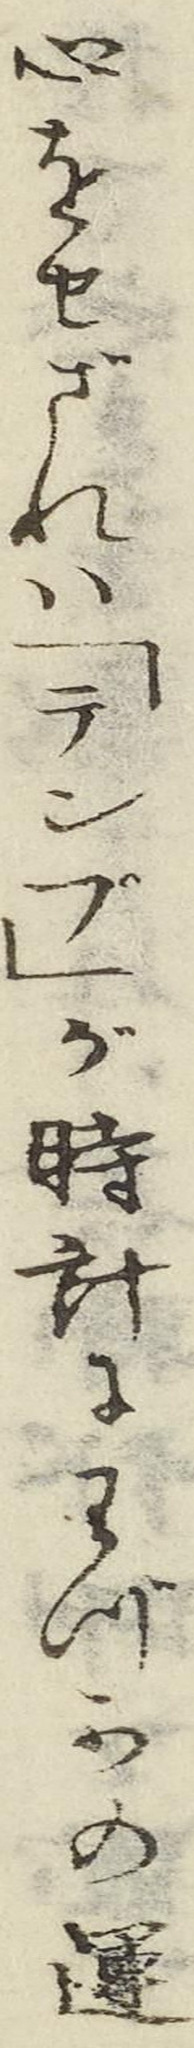心をせざれは「テンプ」が時計にわづかの運
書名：[時計に関する冊子]
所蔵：東京大学地震研究所図書室 Earthquake Research Institute Library, The University of Tokyo, JAPAN
